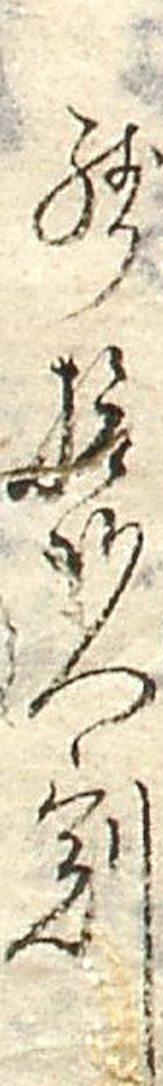残り拾弐人割
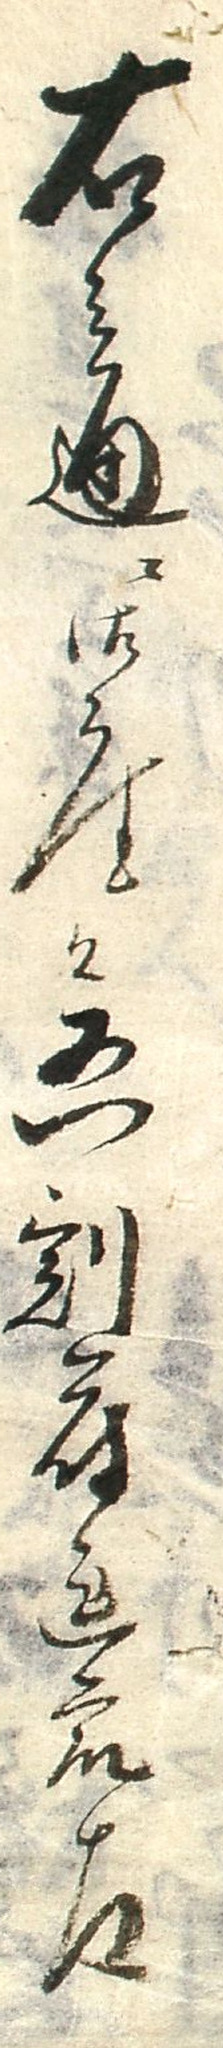右之通に御座候右割符連衆左

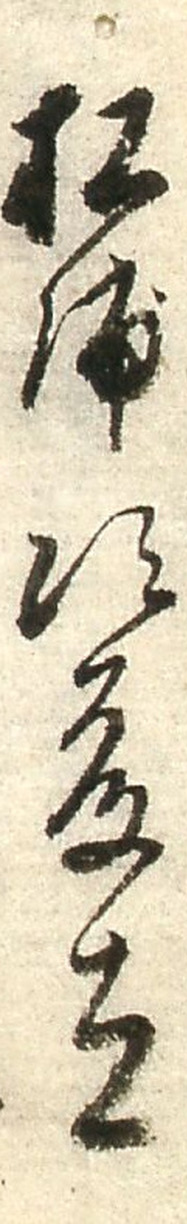松浦次藤太
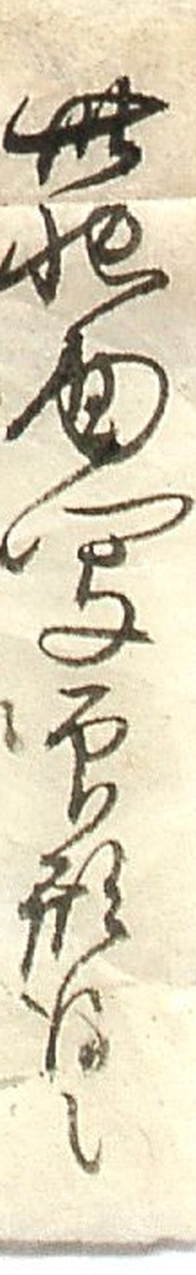此帳面写印形なし
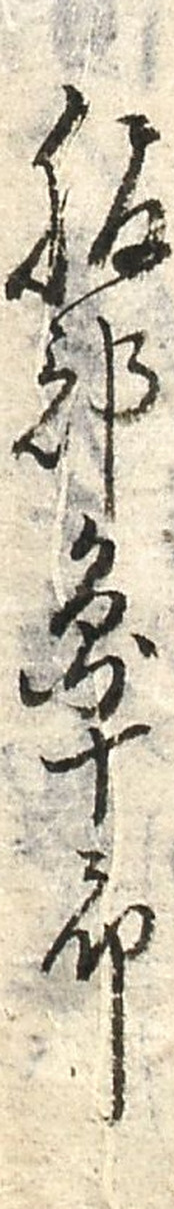服部円十郎
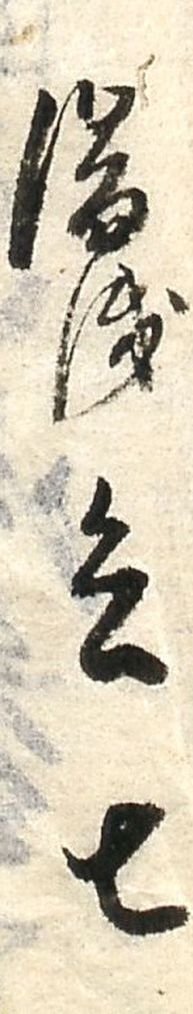湯浅兵七
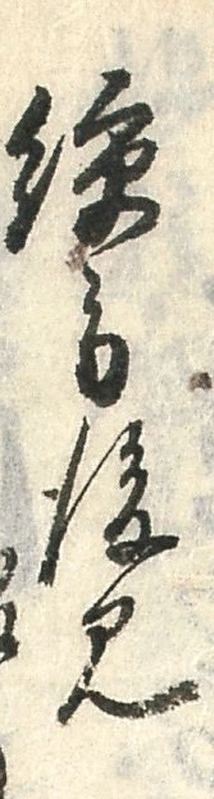絞方後見
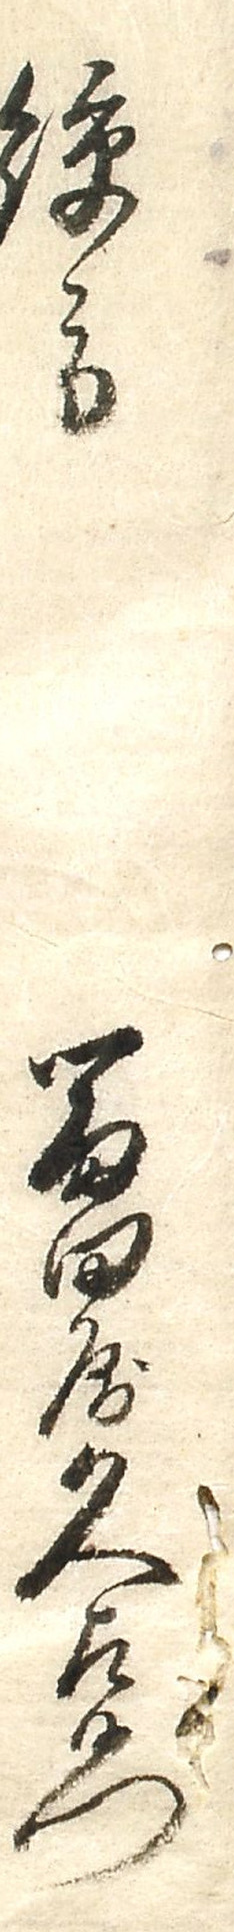絞方冨田屋久左衛門
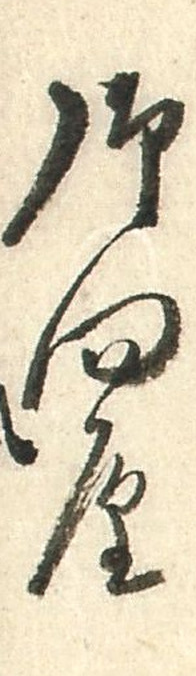御問屋
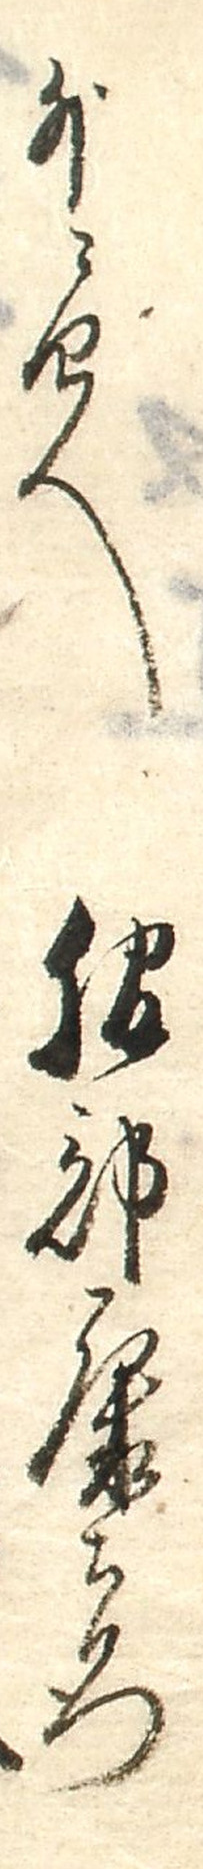外に四人服部康右衛門
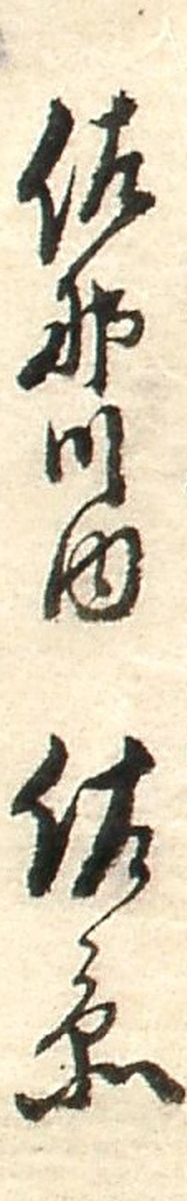佐那川内佐兵衛
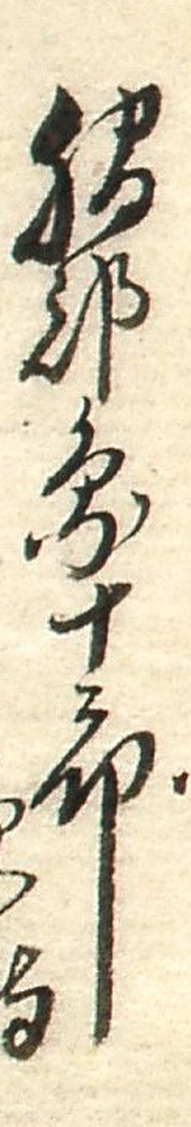服部円十郎

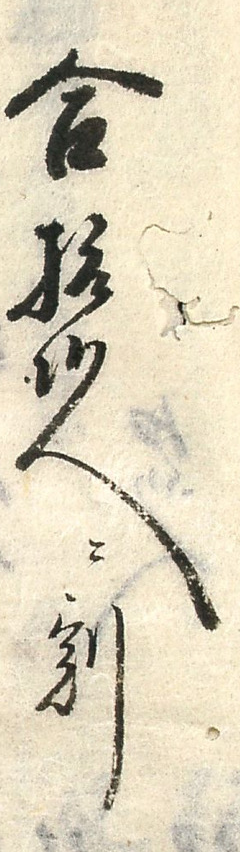合拾弐人に割
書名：櫨実絞方実代指引算用書
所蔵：鳴門教育大学 Naruto University of Education
